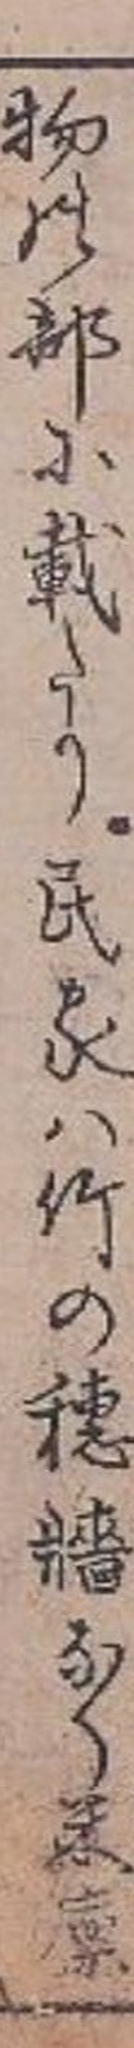物の部に載たり、民家は竹の穂牆なり、米廩
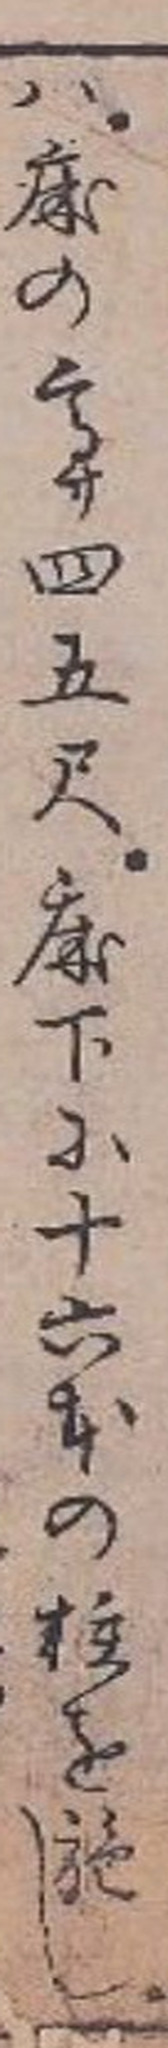は、床の高四五尺、床下に十六本の柱を施し、
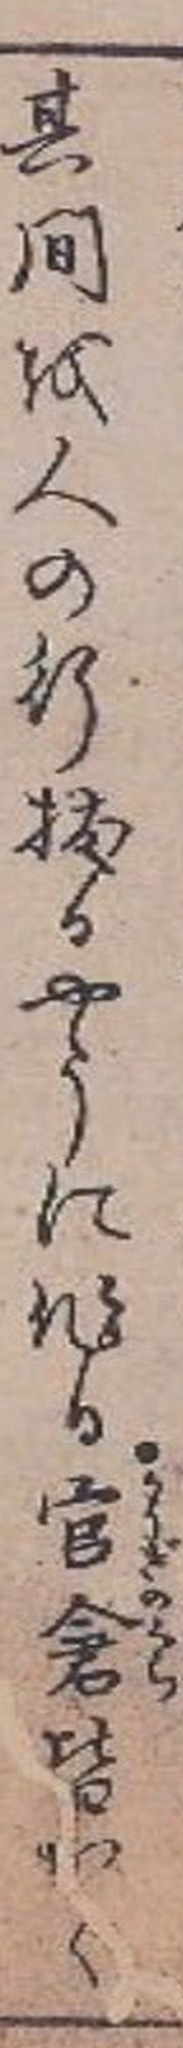其間を人の行抜るやうに作る、官倉皆かく
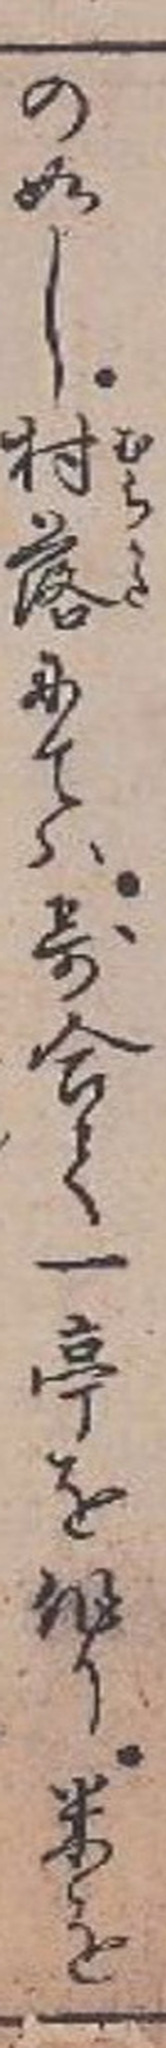の如し、村落にては、寄合て一亭を作り、米を
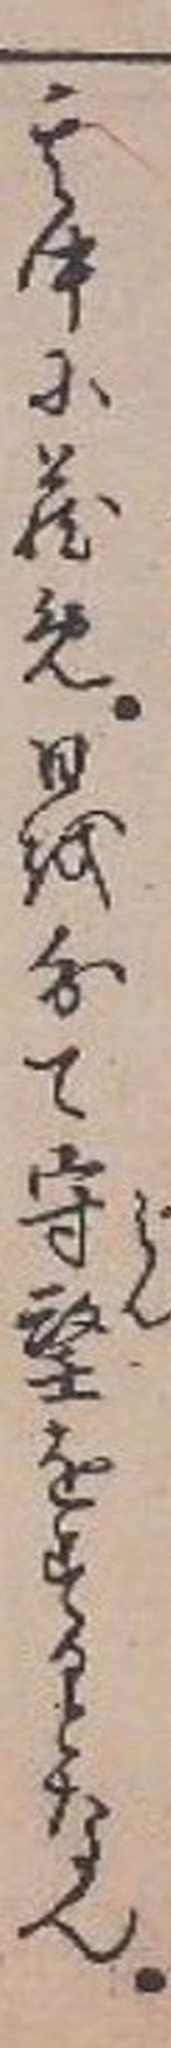其中に蔵め、日を分て守望をするとなん、
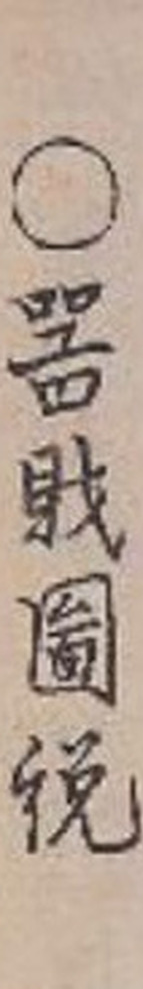○器財図説
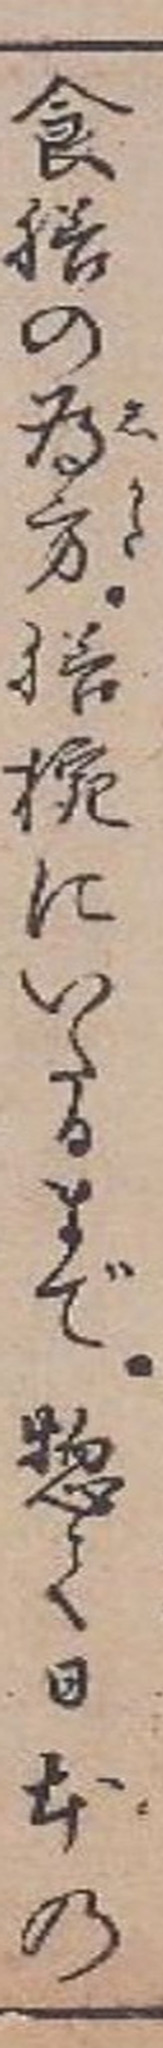食膳の為方、膳椀にいたるまで、惣て日本の
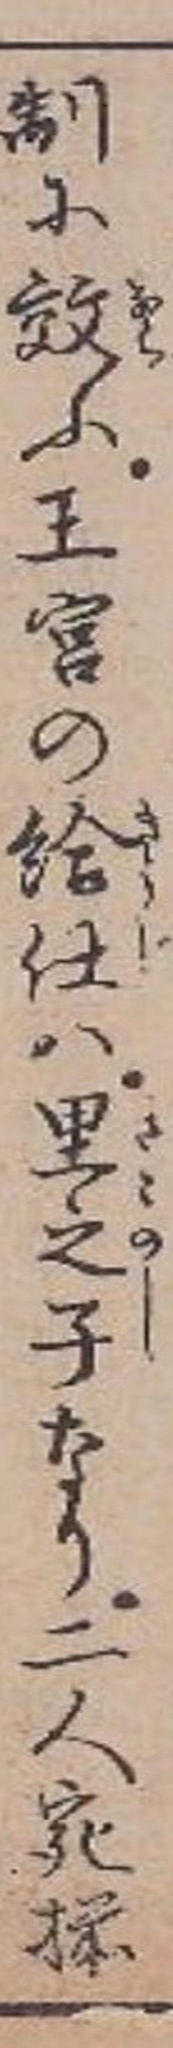制に效ふ、王宮の給仕は、里之子なり、二人宛揃
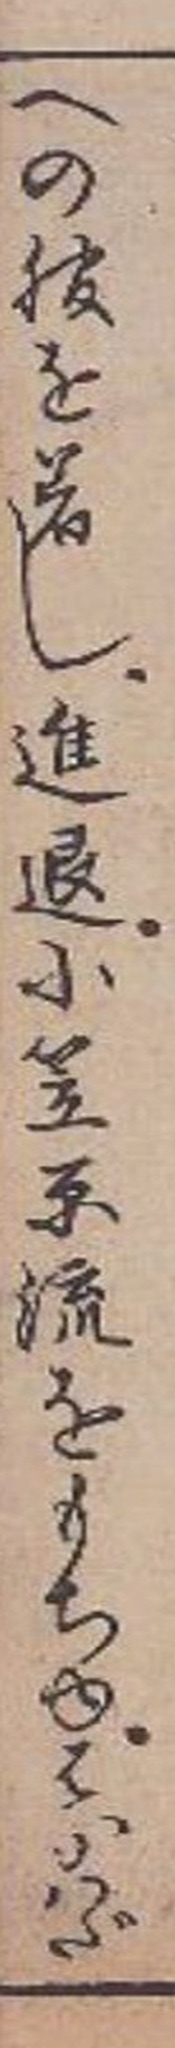への服を着し、進退、小笠原流をもちゆ、はなはだ
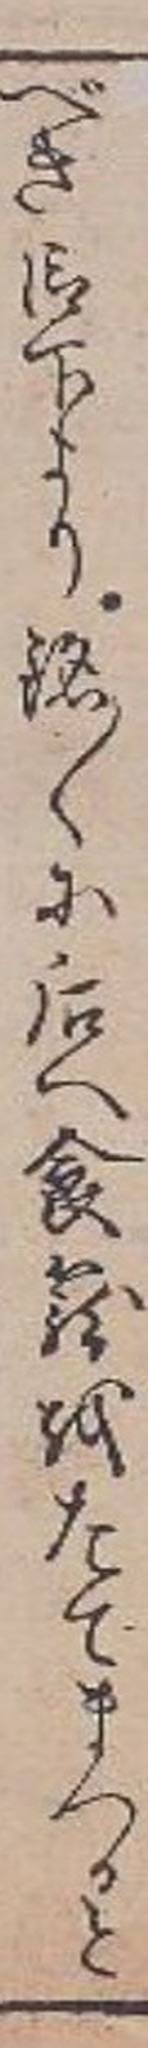べき臣下より、銘〳〵に后へ食籠をたてまつると
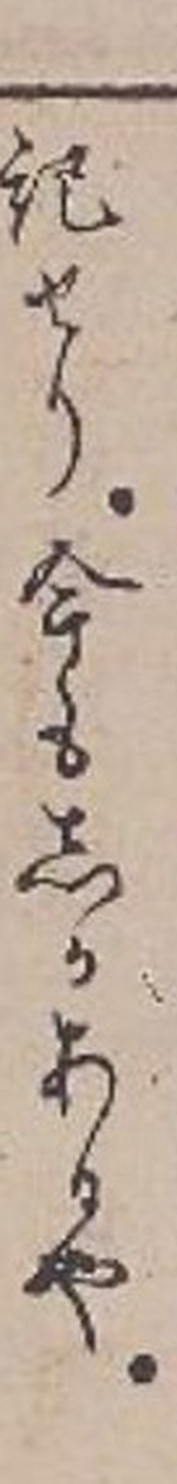記せり、今もしかあるや、
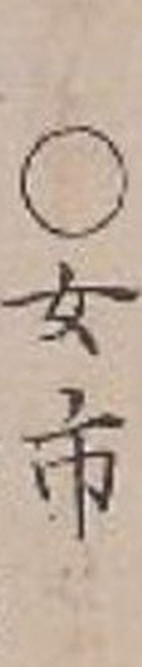○女市
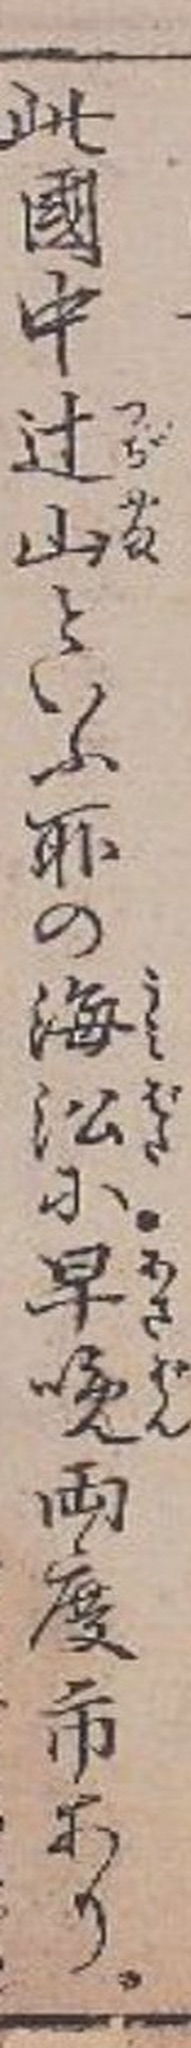此国中辻山といふ所の海沿に、早晩両度市あり、
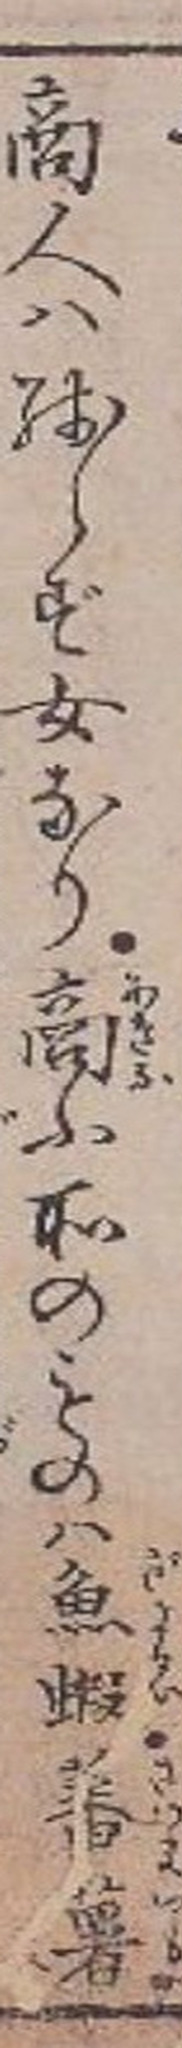商人は残らず女なり、商ふ所のものは魚蝦、蕃薯、
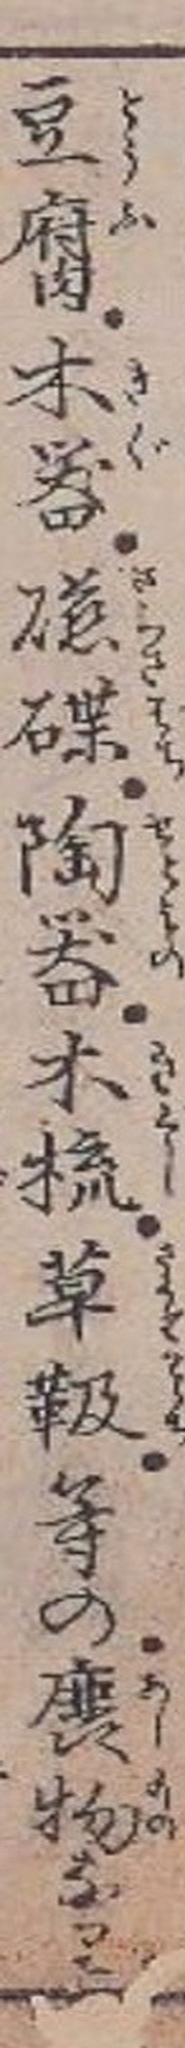豆腐、木器、礠碟、陶器、木梳、草靸、等の、麁物なり、
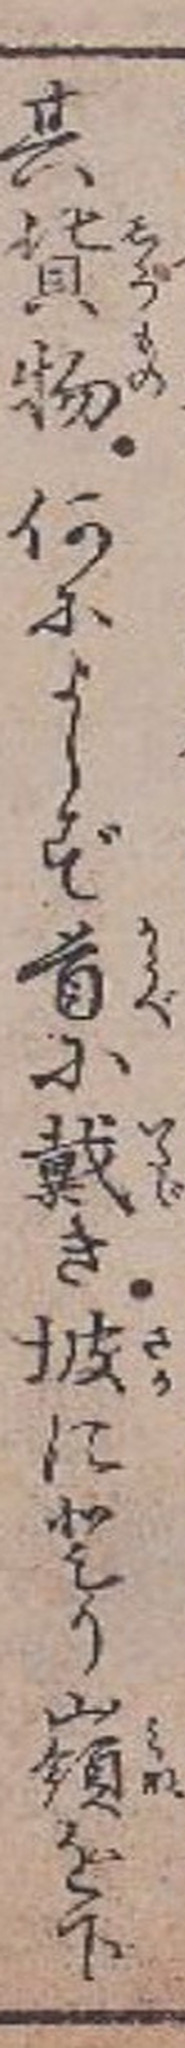其貨物、何によらず首に戴き、坡に登り嶺を下
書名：琉球談
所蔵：University of the Ryukyus Library
